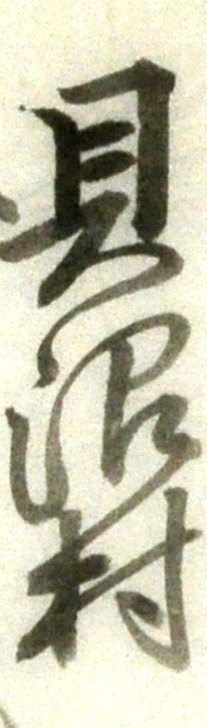貝沼村
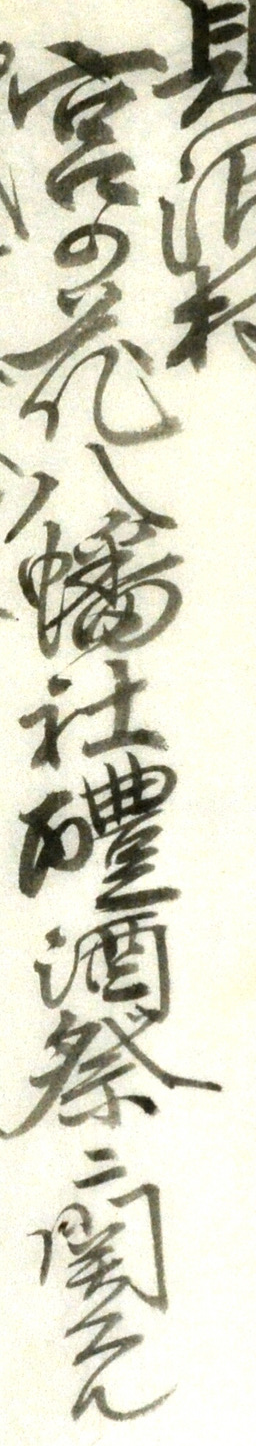宮の花八幡社醴酒祭ニ関スル
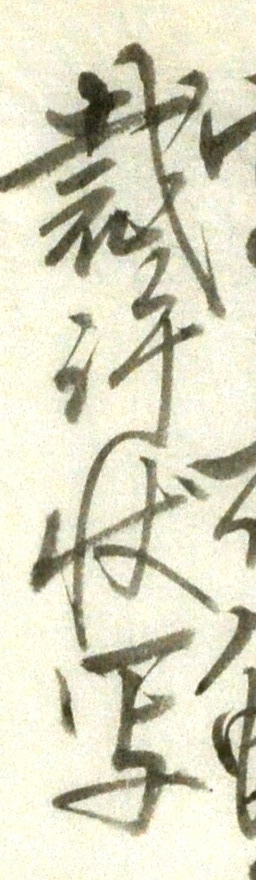裁許状写

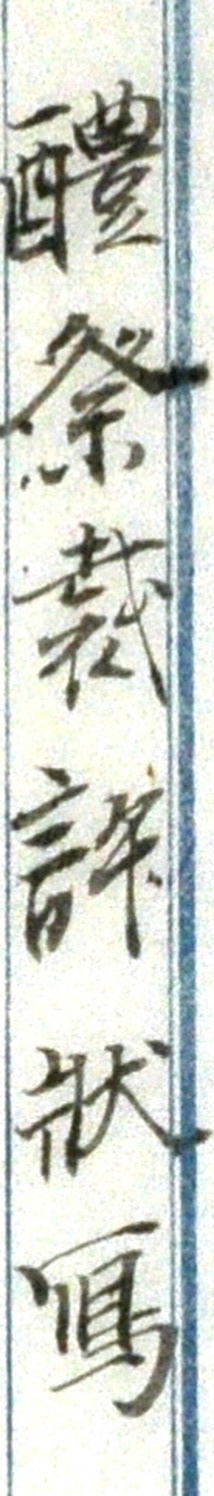醴祭裁許状写
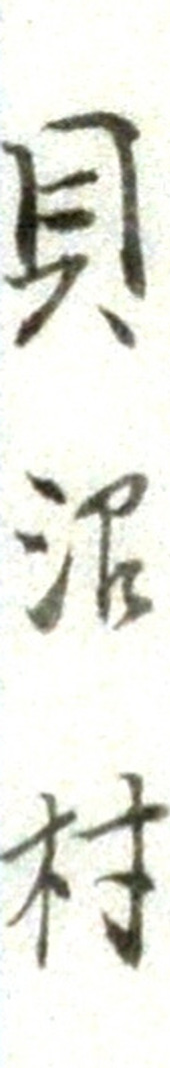貝沼村
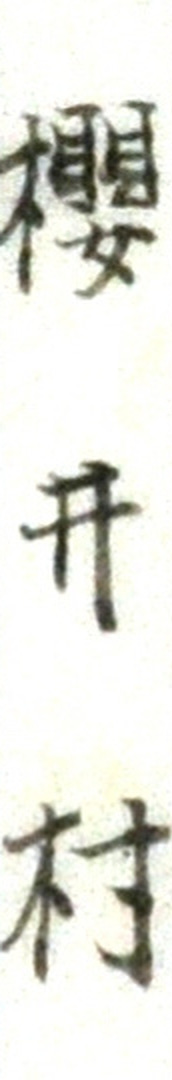桜井村
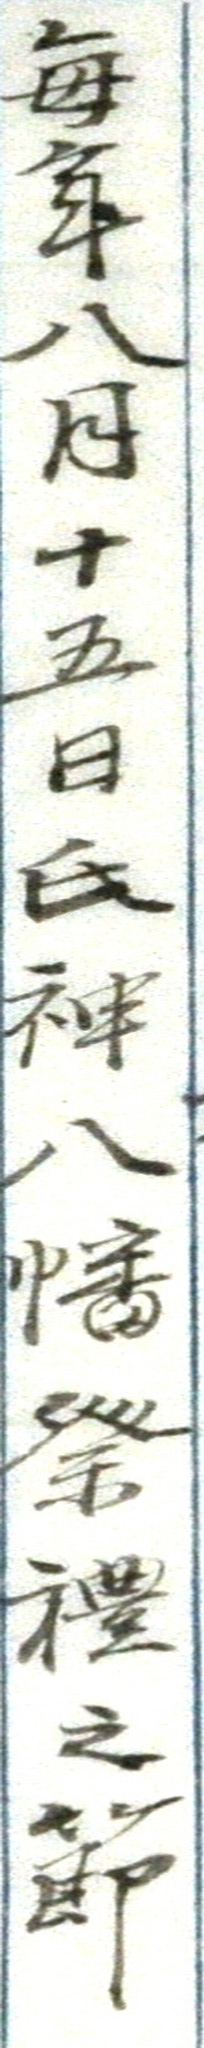毎年八月十五日氏神八幡祭礼之節
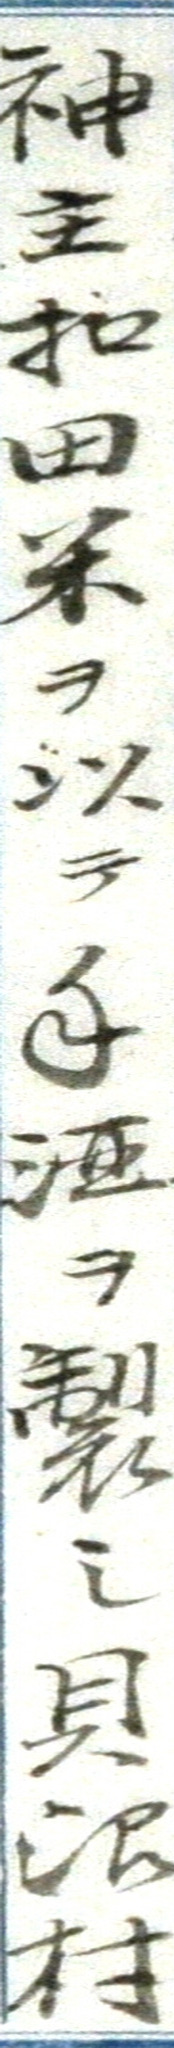神主扣田米ヲ以テ手酒ヲ製シ貝沼村
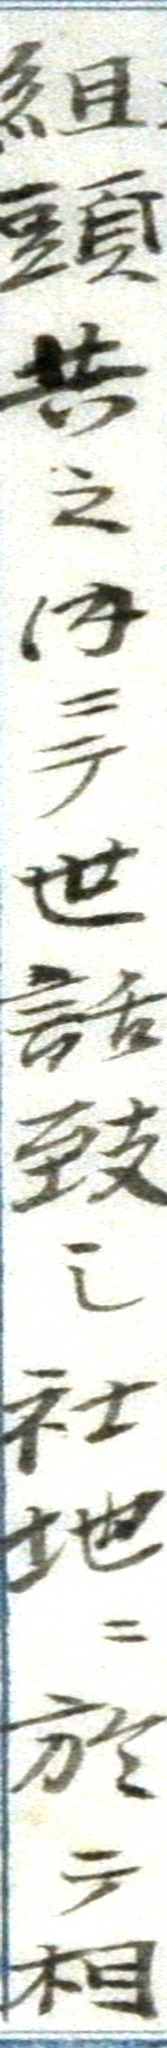組頭共之内ニテ世話致シ社地ニ於テ相
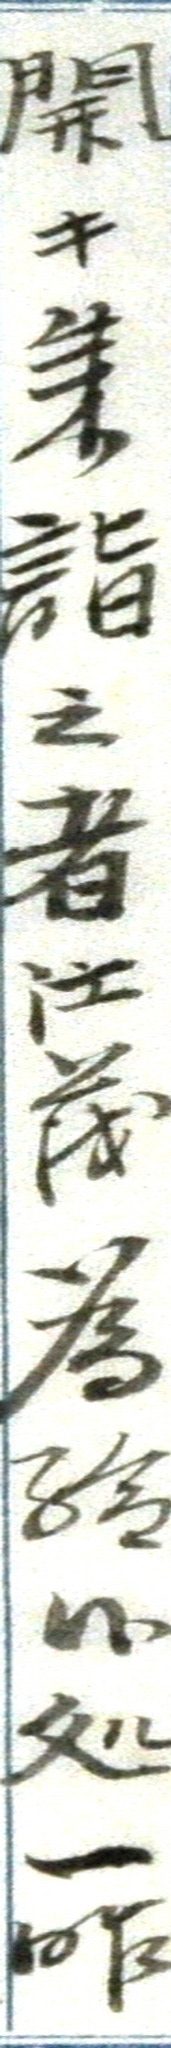開キ参詣之者江茂為給候処一昨
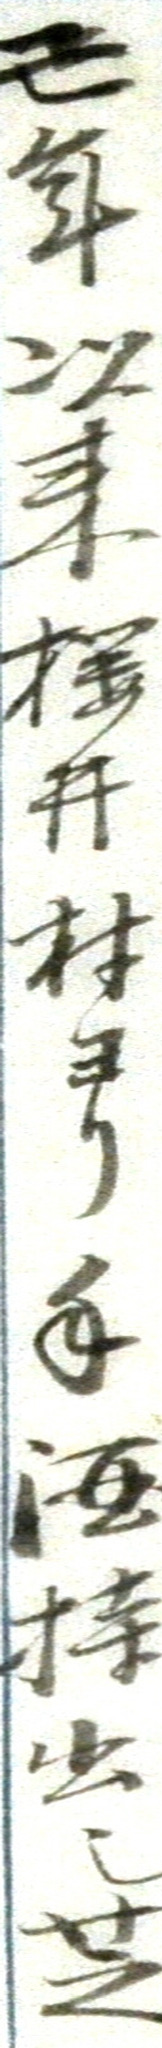丑年以来桜井村ヨリ手酒持出シ芝
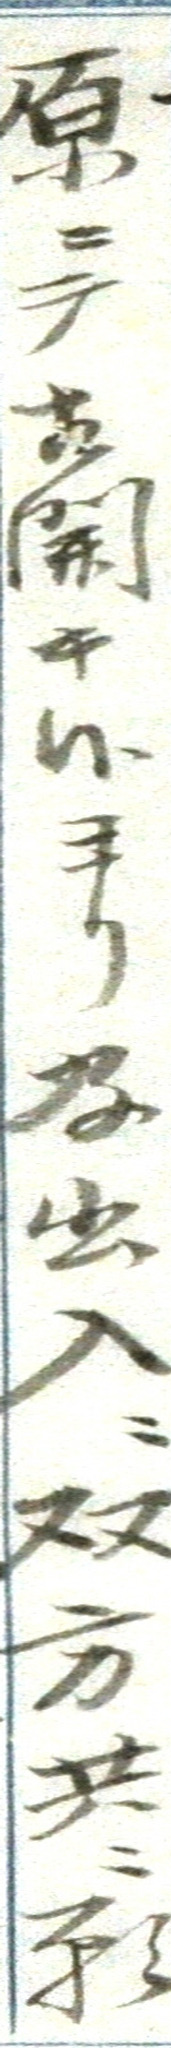原ニテ相開キ候ヨリ及出入ニ双方共ニ願
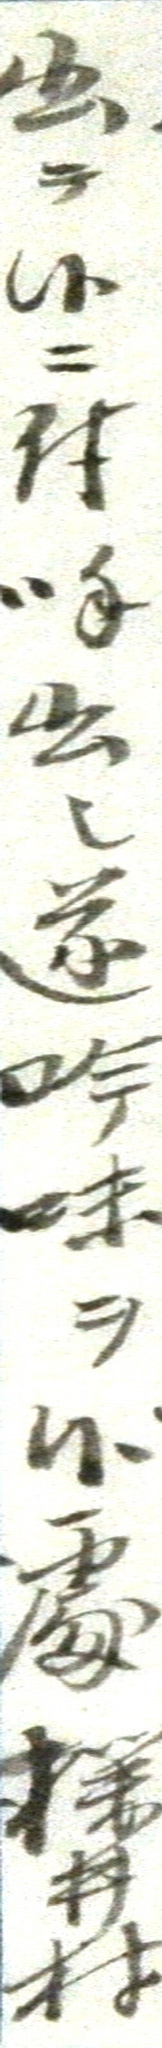出テ候ニ付呼出シ遂吟味ヲ候処桜井村
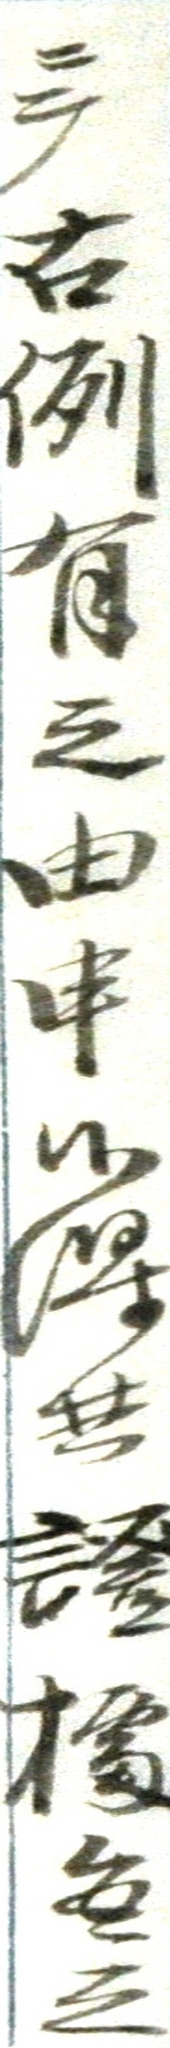ニテ古例有之由申候得共証拠無之
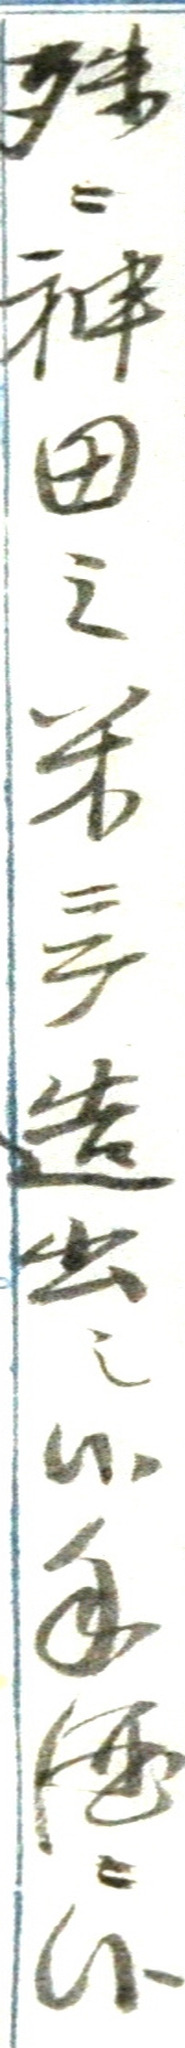殊ニ神田之米ニテ造出シ候手酒ニ候

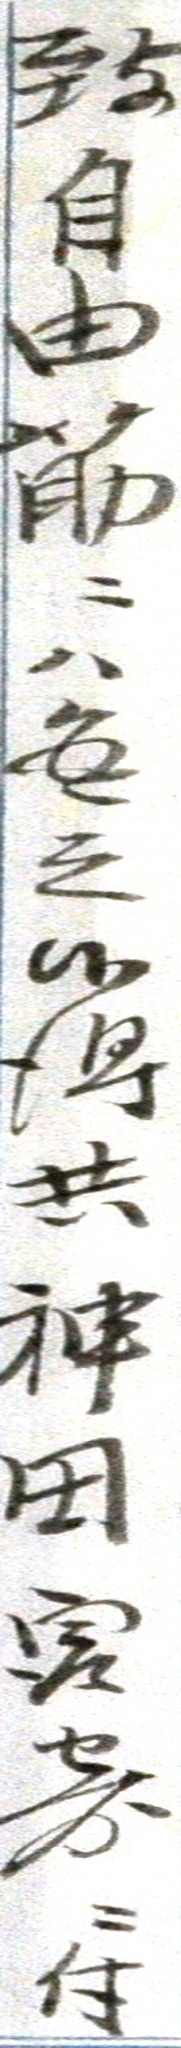致自由筋ニハ無之候得共神田最寄ニ付
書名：貝沼村八幡社醴酒祭ニ関スル裁許状（写）
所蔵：伊那市立高遠町図書館・合同会社AMANE
